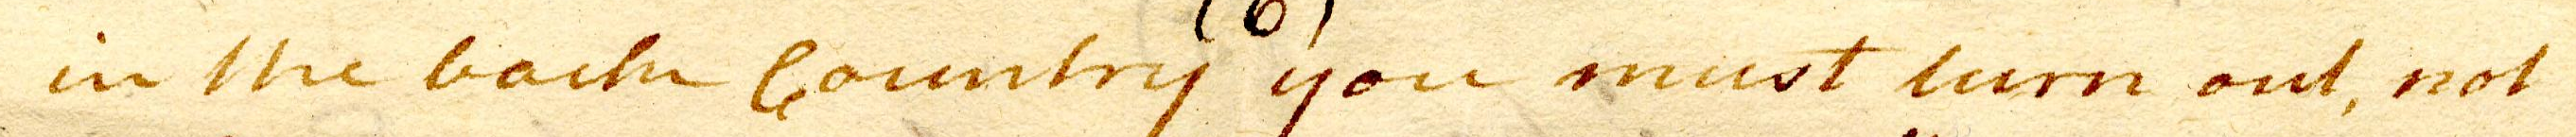in the back Country you must turn out, not
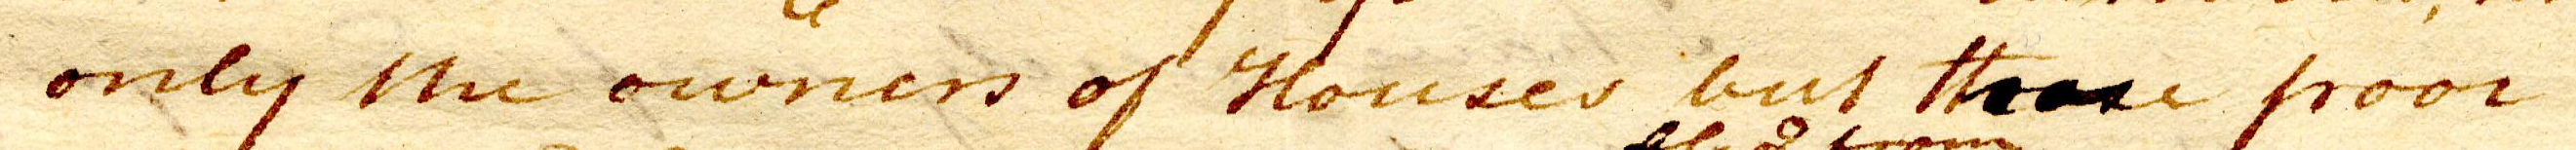only the owners of Houses but those poor
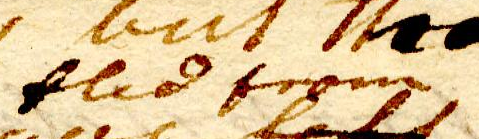fled from
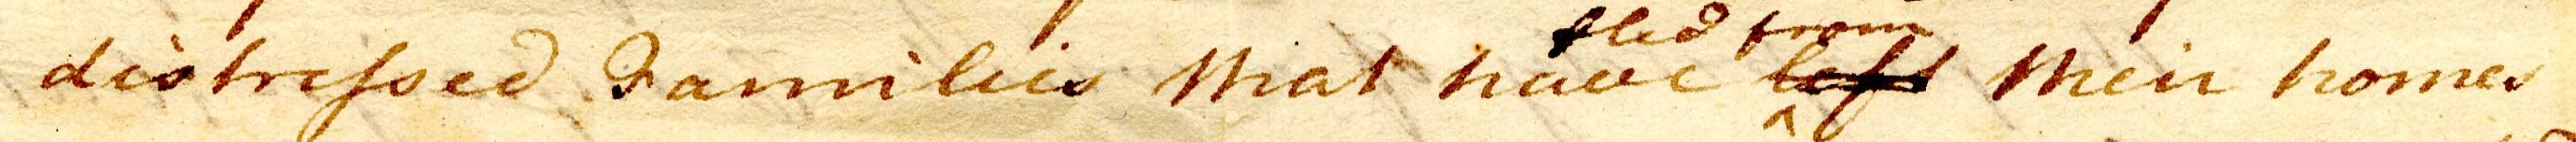distressed families that have ^ [left] their homes
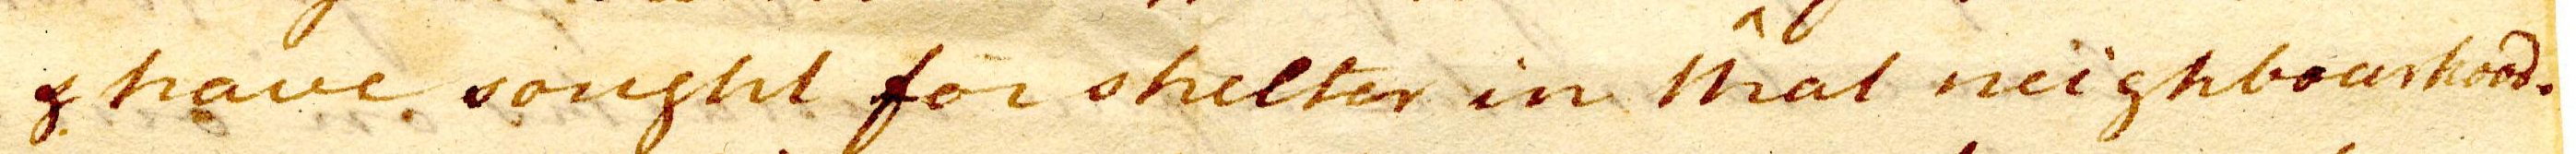& have sought for shelter in that neighbourhood.
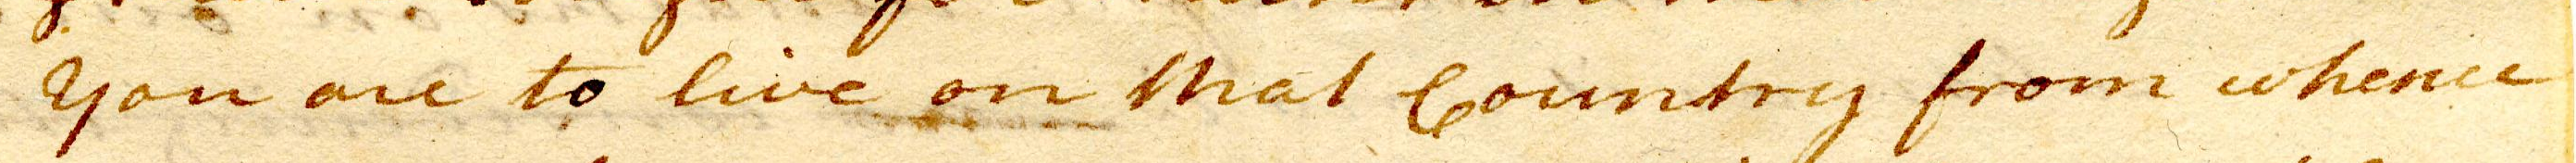You are to live on that Country from whence
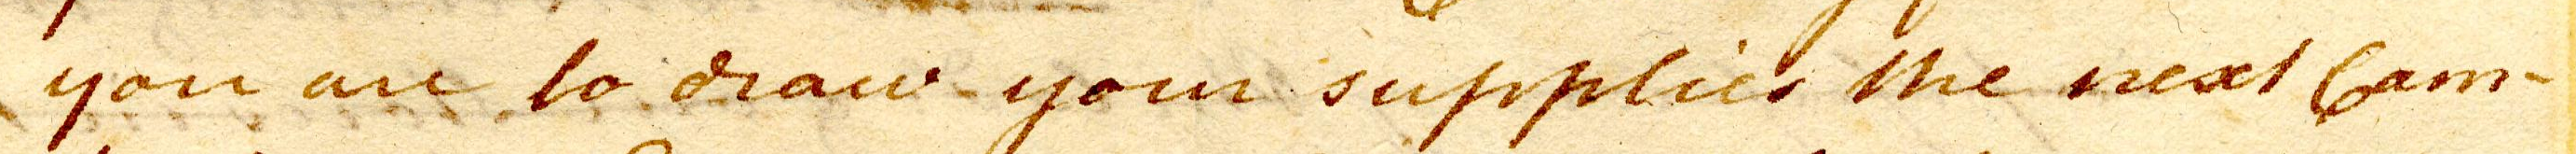You are to draw your supplies the next Cam-
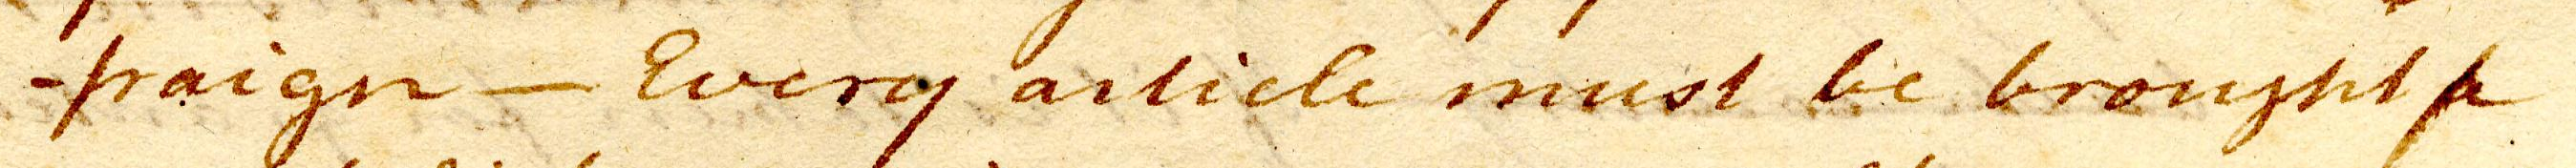-paign- Every article must be brought a
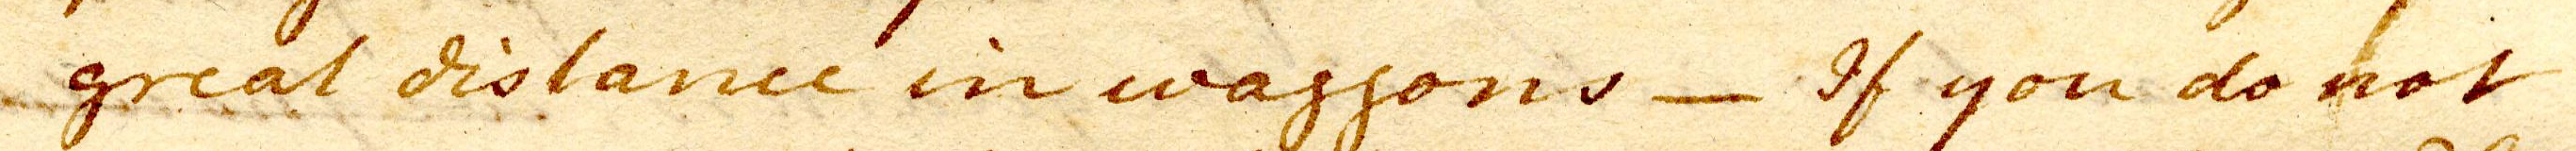great distance in waggons- If you do not
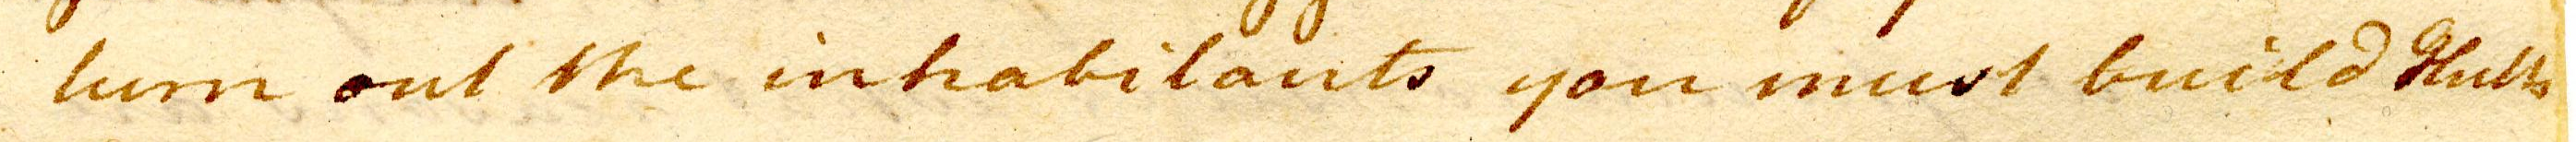turn out the inhabitants you must build Hutts
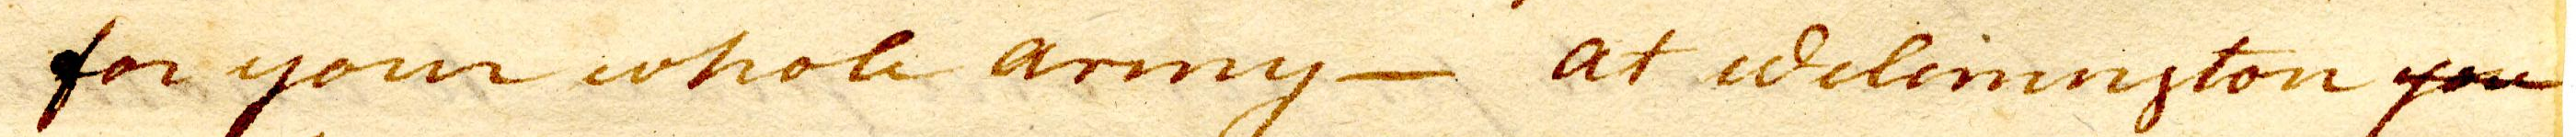for your whole Army- At Wilmington [you]
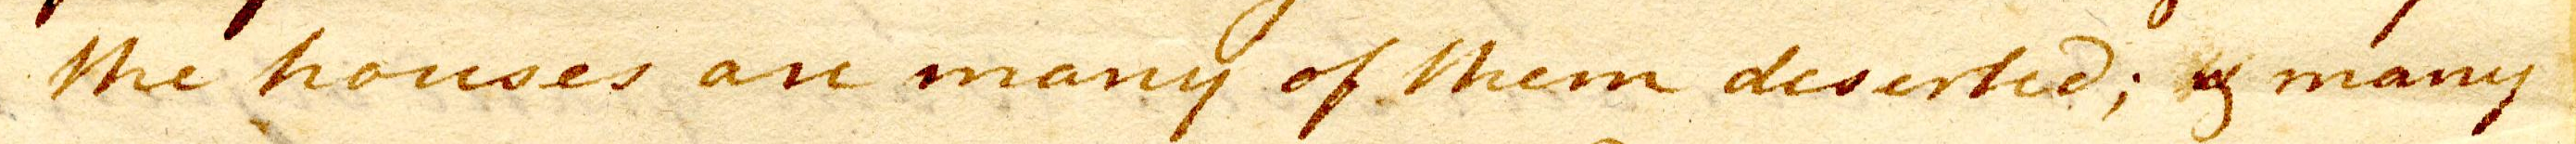the houses are many of them deserted; & many
